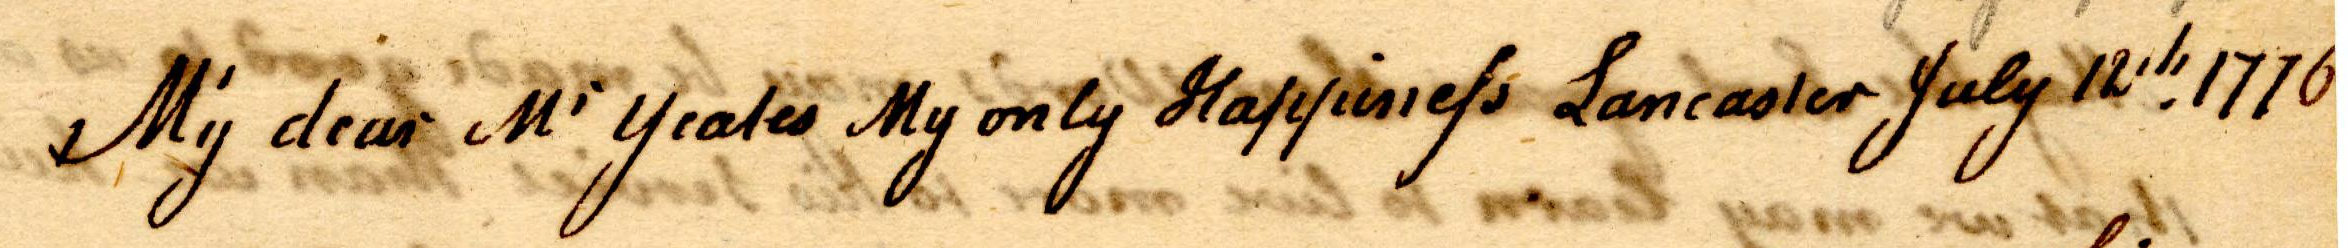My dear M^r Yeates My only Happiness Lancaster July 12^th. 1776
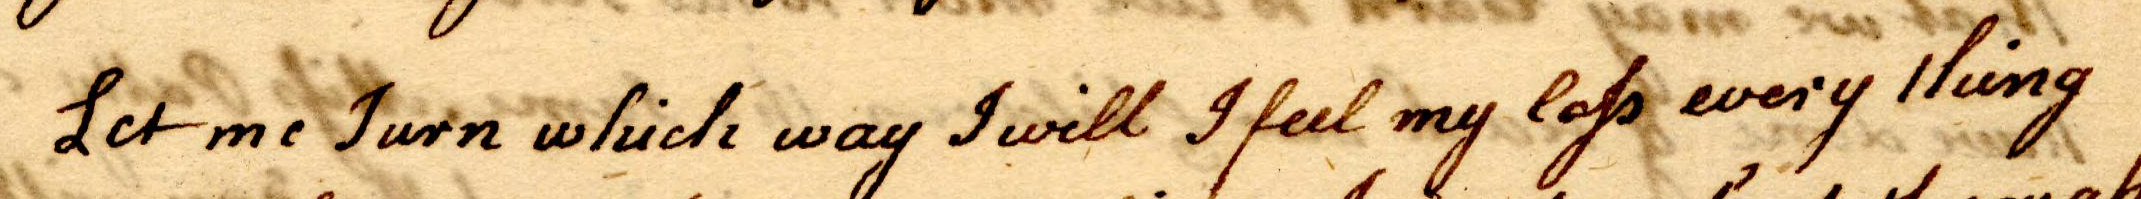Let me Turn which way I will I feel my loss every thing
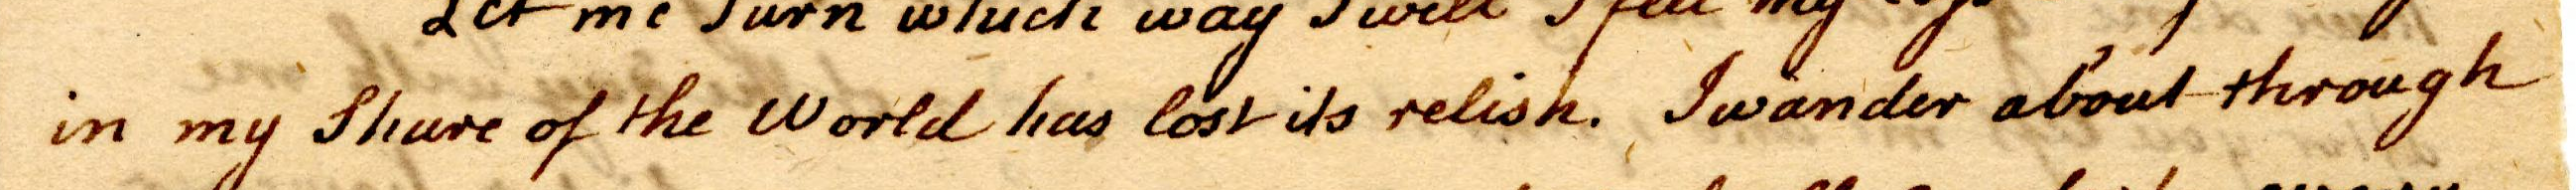in my Share of the World has lost its relish. I wander about through
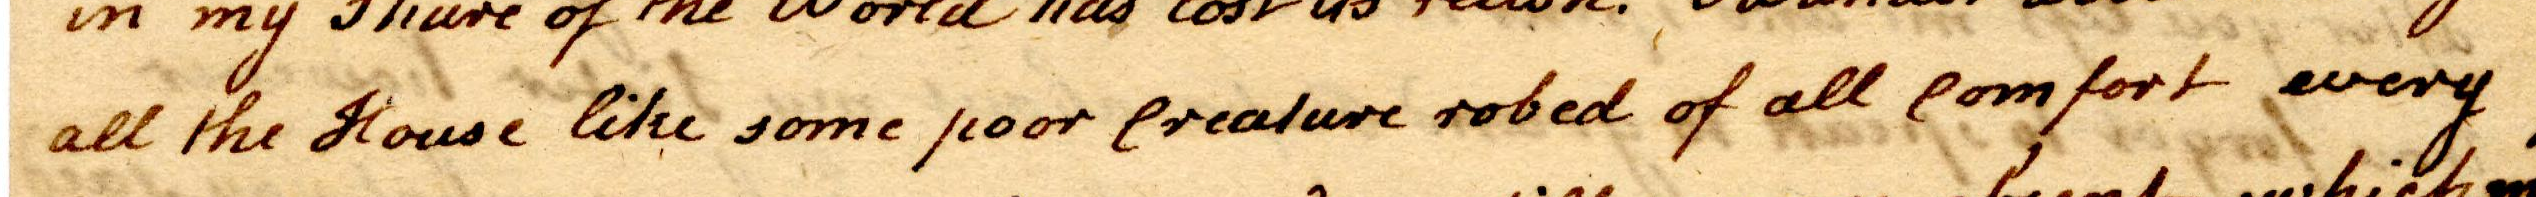all the House like some poor creature robed of all comfort every
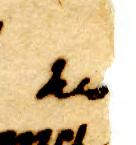kes
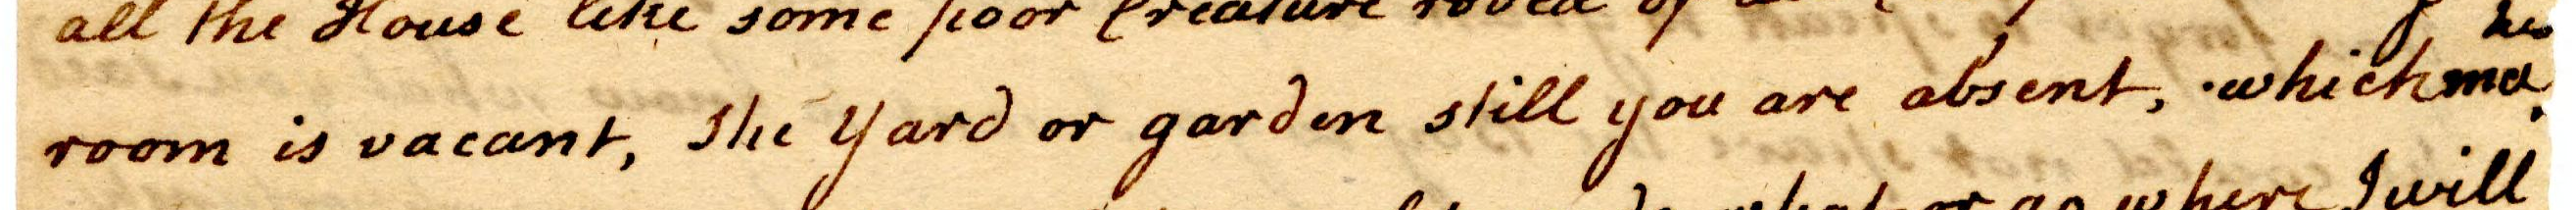room is vacant, the yard or garden still you are absent, which ma^
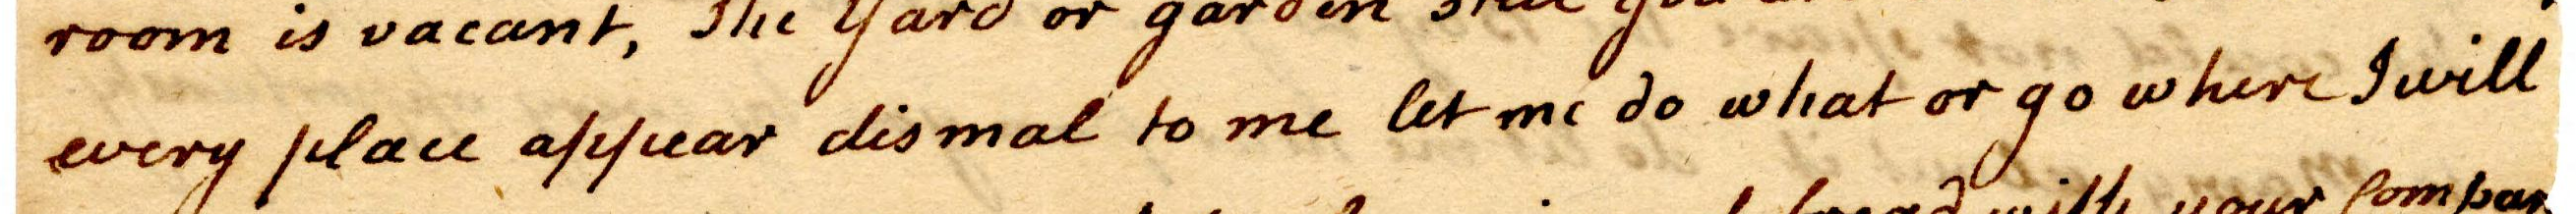every place appear dismal to me let me do what or go where I will
